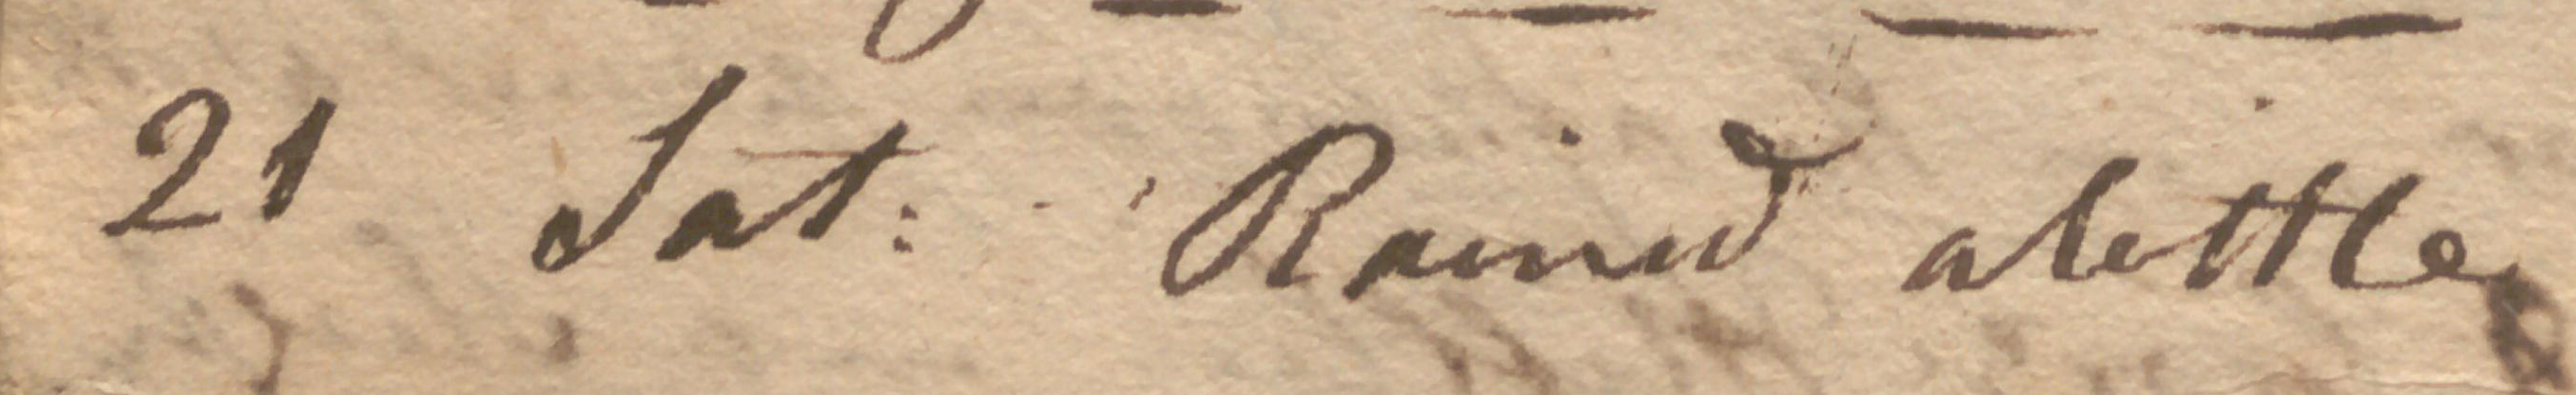21 Sat. Rained a little
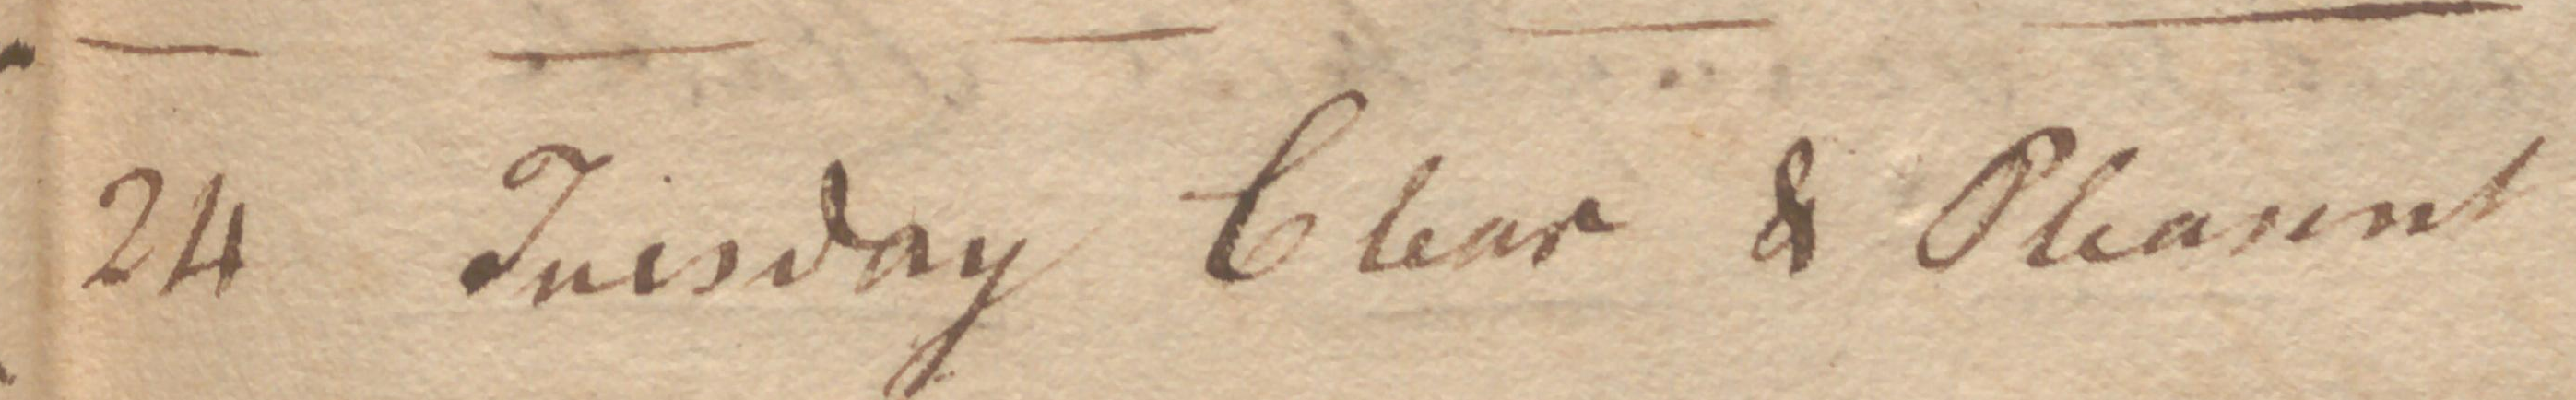24 Tuesday Clear & Pleasent
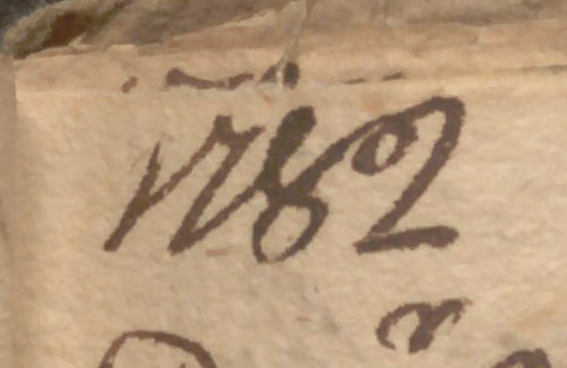1782
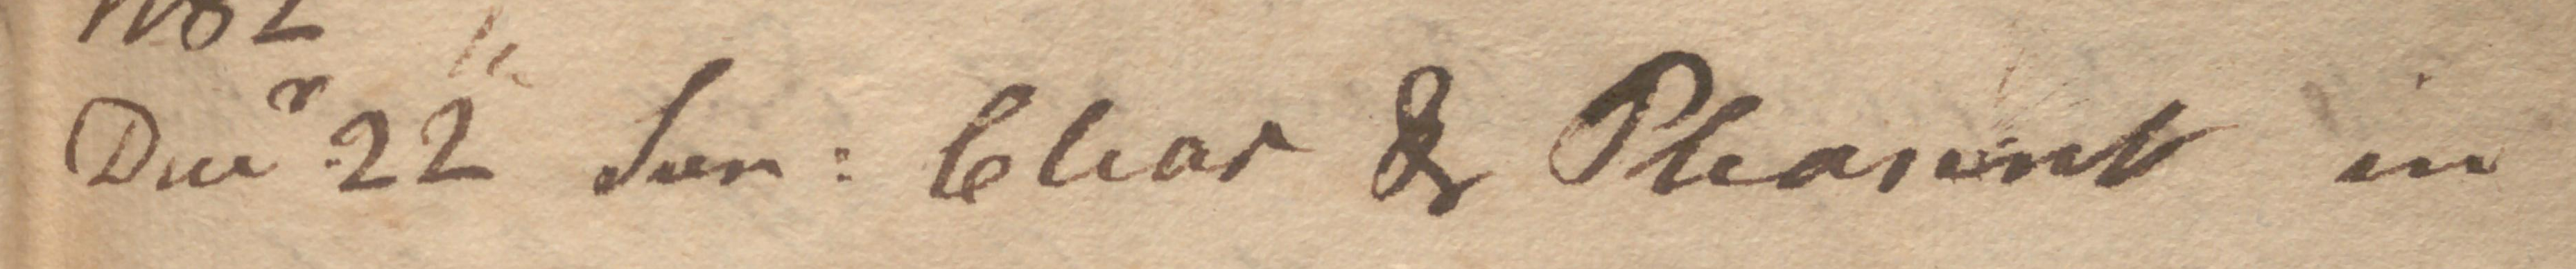Dece^r. 22 Sun: Clear & Pleasent in
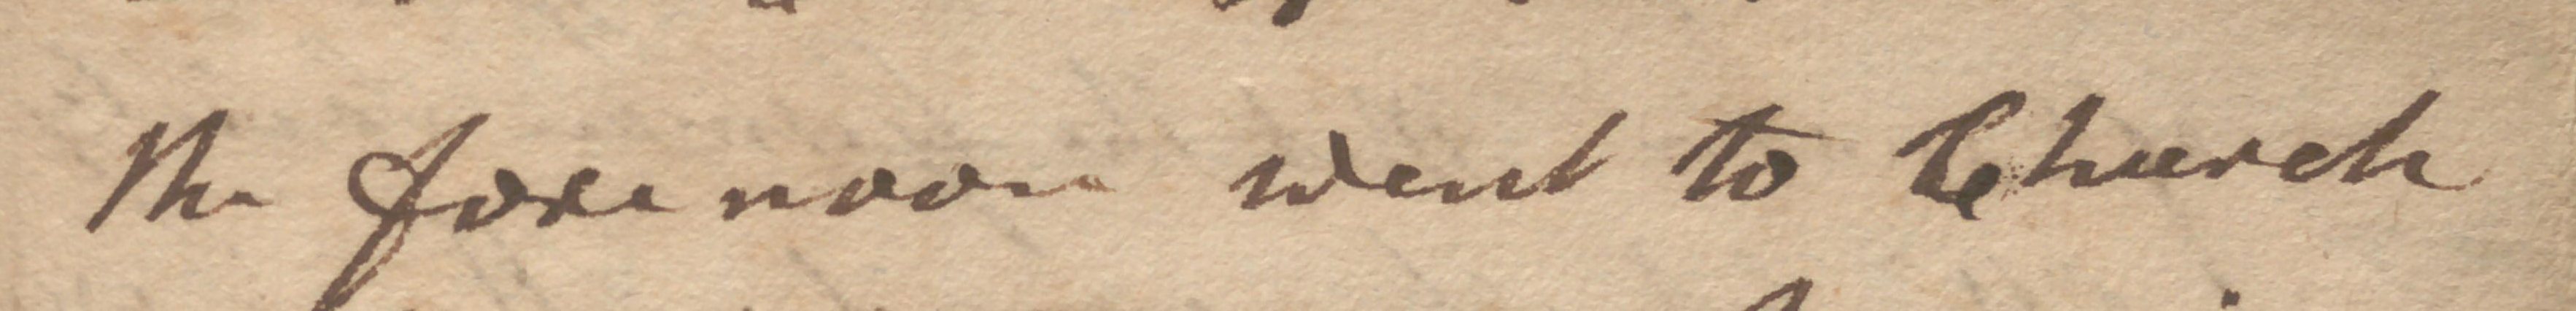the forenoon went to Church
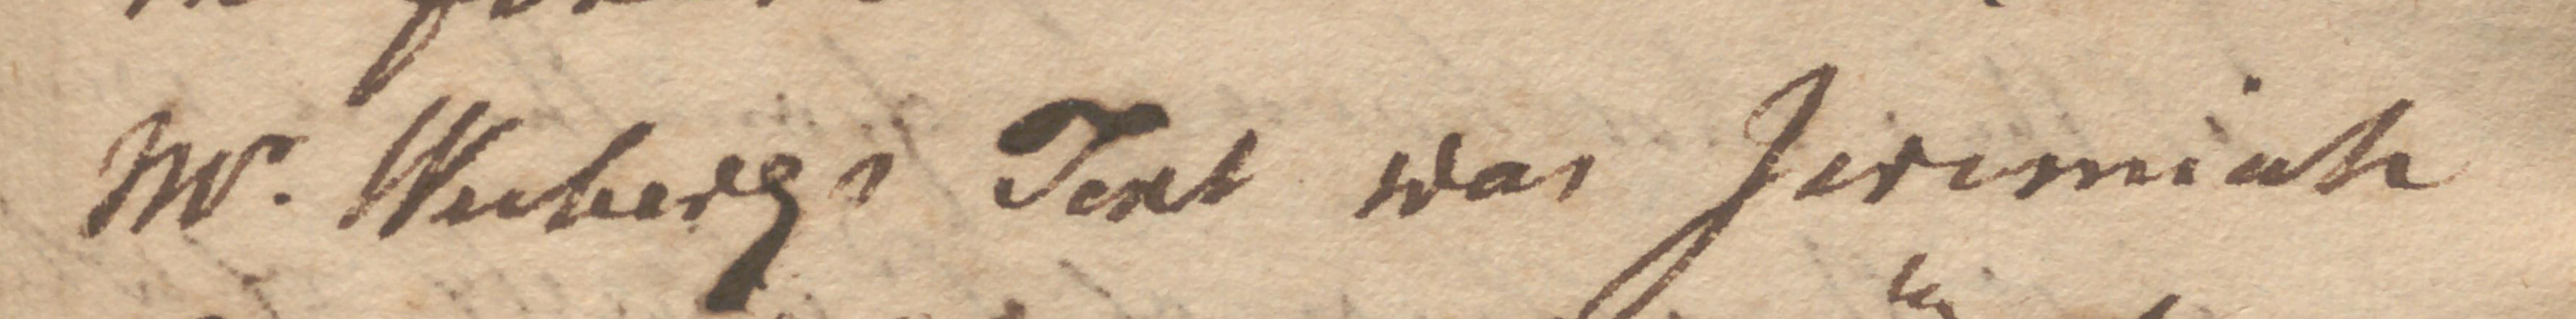M^r. Weibergs Text was Jeremiah
